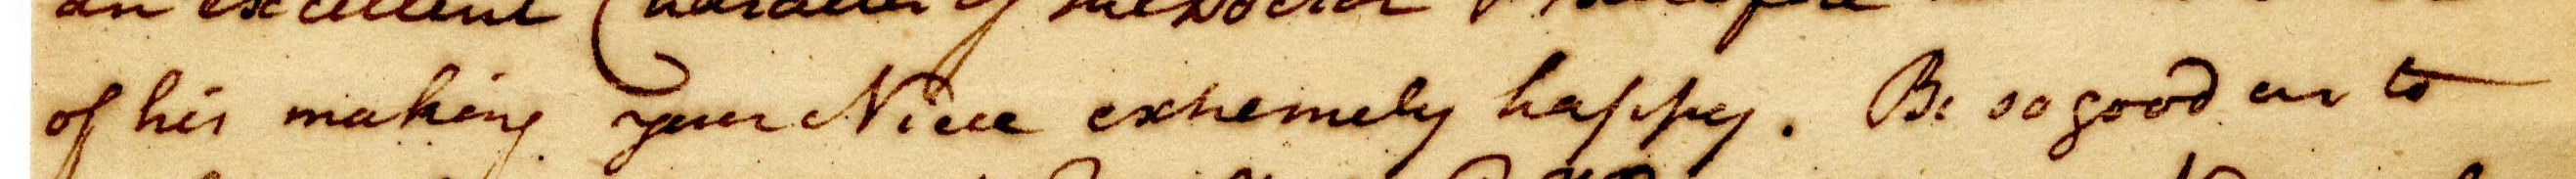of his making your Niece extremely happy. Be so good as to
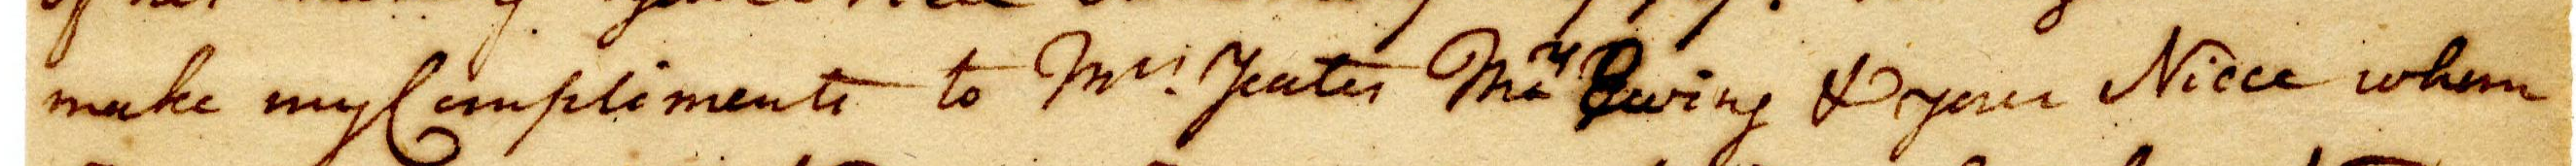make my Compliments to M^rs Yeates M^rs Ewing & your Niece when
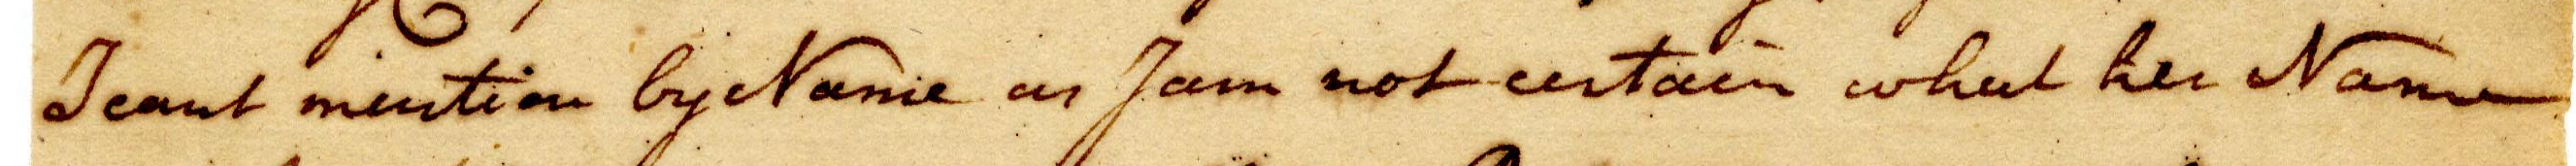I cant mention by Name as I am not certain what her Name
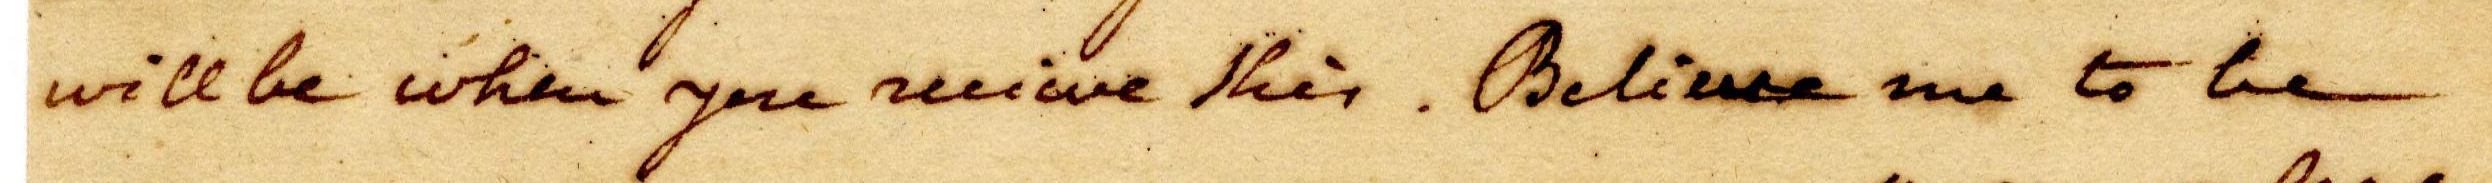will be when you receive this. Believe me to be
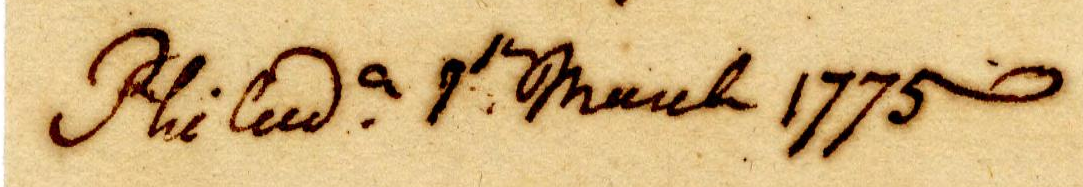Philad^a 9^th March 1775
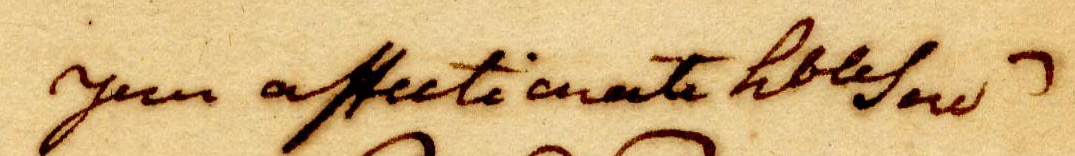your affectionate h^ble Serv^t
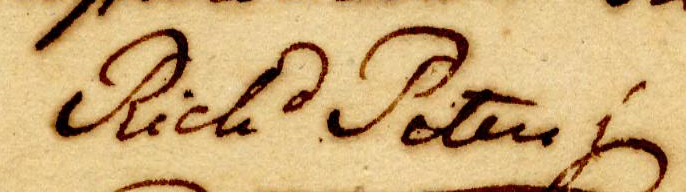Rich^d Peters
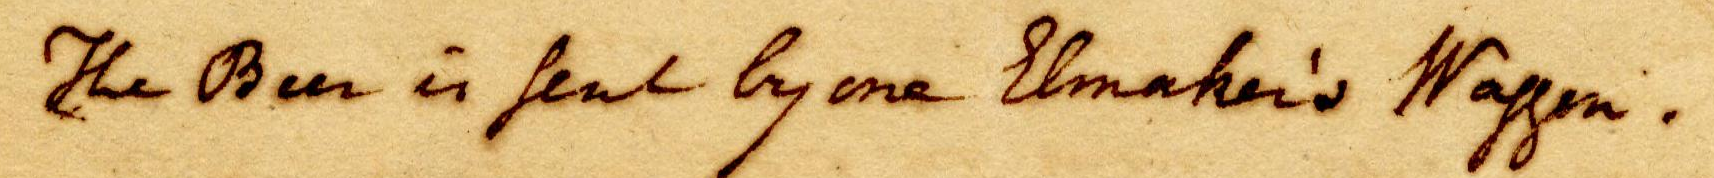The Beer is sent by one Elmaker's Waggon.
